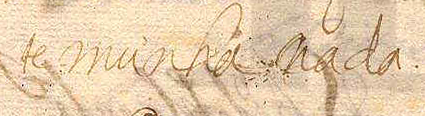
temunha nada.
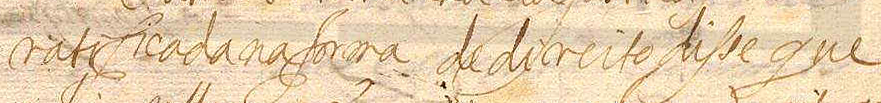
ratificada na forma de direito disse que
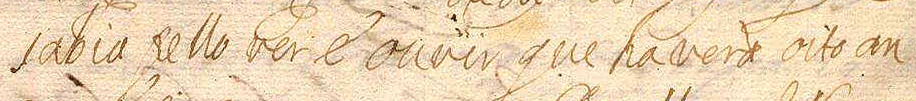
sabia pello ver e ouuir que havera oito an
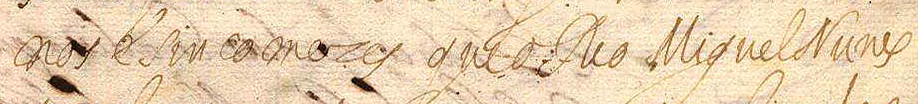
nos e sinco mezes que o Reo Miguel Nunes
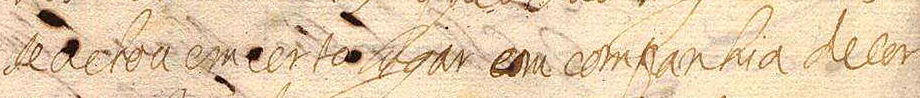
se achou em certo lugar em companhia de cer
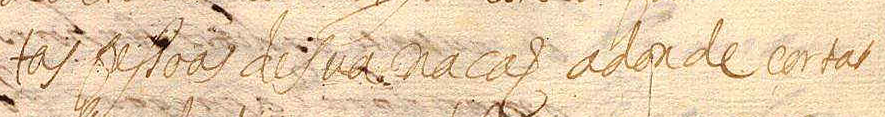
tas pessoas de sua naçaõ adonde certas
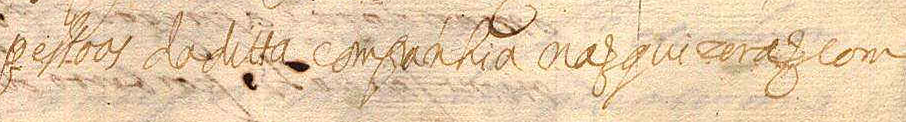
pessoas da ditta companhia naõ quizeraõ com
